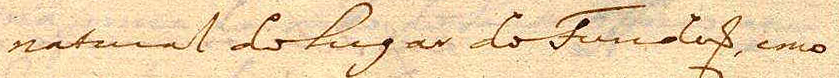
natural do Lugar do Fundaõ, e mo
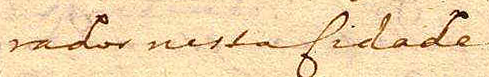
rador nesta Cidade.
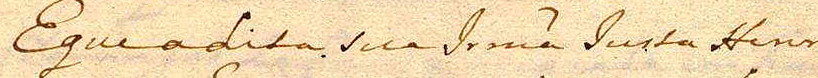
E que a dita sua Irmã Iusta Henr
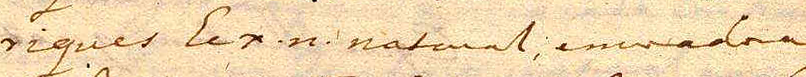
riques he x. n. natural, e moradora
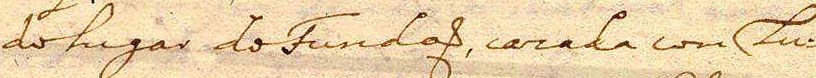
do Lugar do Fundaõ, cazada com Lu
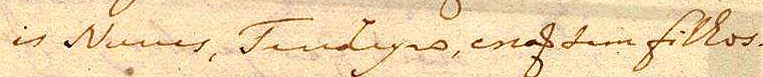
is Nunes, Tendeyro, e naõ tem filhos.
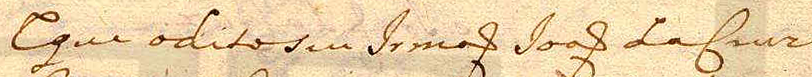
E que o dito seu Irmaõ Ioaõ da Cruz
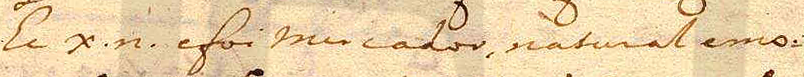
he x. n. e foi mercador, natural e mo
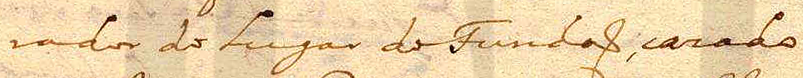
rador do Lugar do Fundaõ, cazado
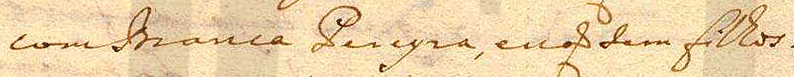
com Branca Pereyra, e naõ tem filhos.
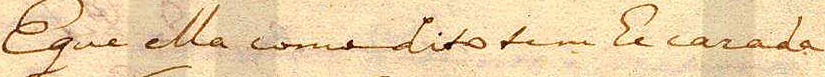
E que ella como dito tem he cazada
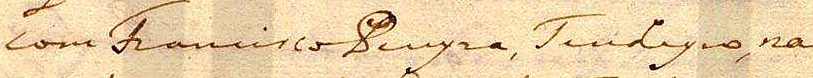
com Francisco Pereyra, Tendeyro, na
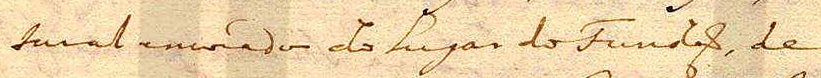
tural e morador do Lugar do Fundaõ, de
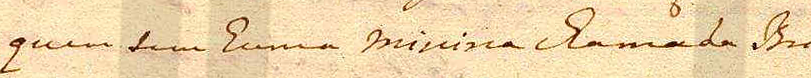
quem tem huma minina chamada Bri
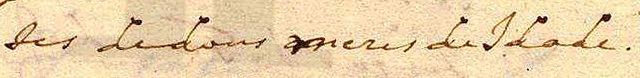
tes de dous mezes de Idade.
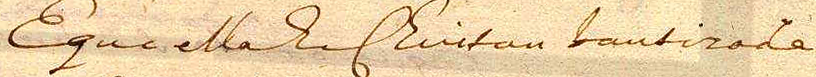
E que ella he Christan bautizada
